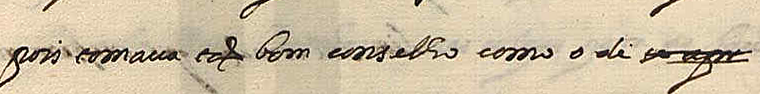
pois tomaua taõ bom conselho como o de se apre
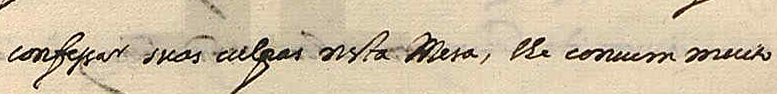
confessar suas culpas nesta Mesa, lhe conuem muito
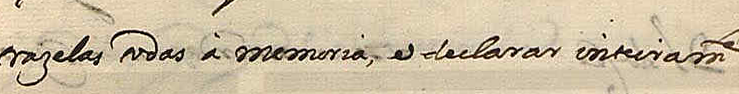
trazelas todas à memoria, e declarar inteiramte
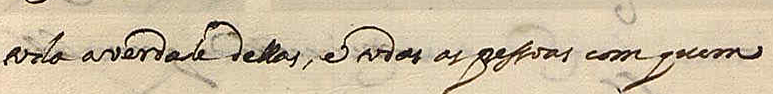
toda a verdade dellas, e todas as pessoas com quem
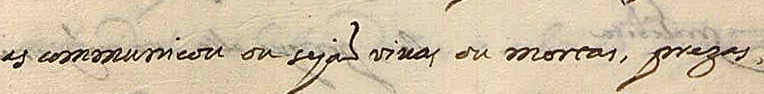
as communicou ou sejaõ viuas ou mortas, prezas,
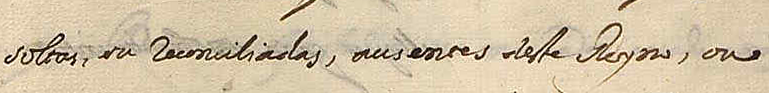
soltas, ou Reconciliadas, ausentes deste Reyno, ou
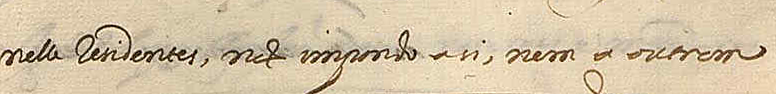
nelle Residentes, naõ impondo a si, nem a outrem
